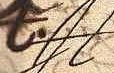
4. item
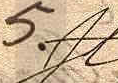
5. item
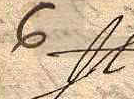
6 item
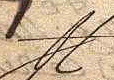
7 item
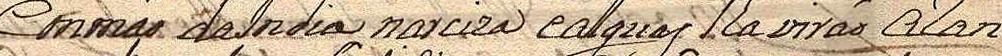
em mão da India narciza e alguas lha virão aRan
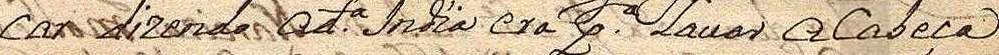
car dizendo a dt.a India era p.a Lavar a Cabeça
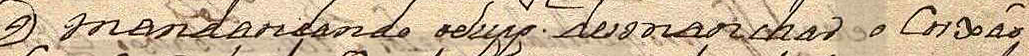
q̄ mandandando o supp.te desmanchar o corxaõ
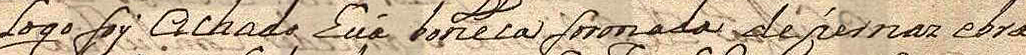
logo foy achado huā boneca formada de pernaz e bra
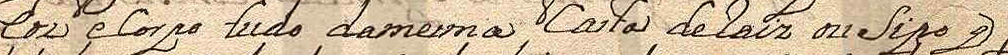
çoz e corpo tudo da mesma Casta de Raiz ou sipo q̄
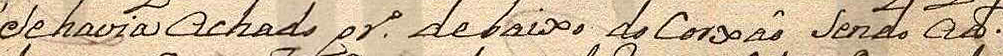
se havia achado pr.o debaixo do corxaõ sendo a dt.a
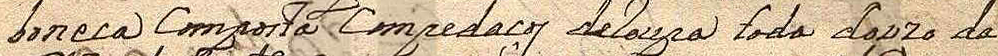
boneca composta com pedaços de Roupa toda do uzo da
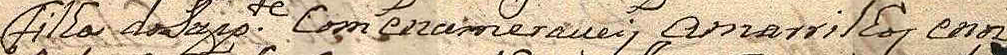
Filha do Supp.te com enumeraveis amarrilhos e noz
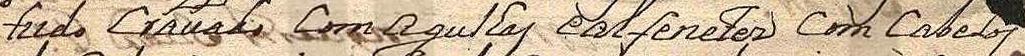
tudo crauado com agulhas e alfenetez com cabelos
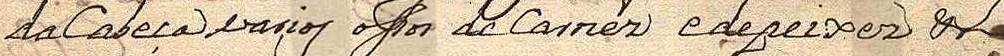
da Cabeça varios ossos de carnez e de peixes &a
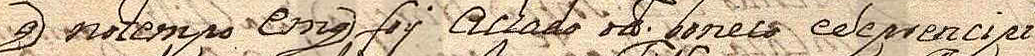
q̄ no tempo em q̄ foy achado o dt.o boneco e se prencipi
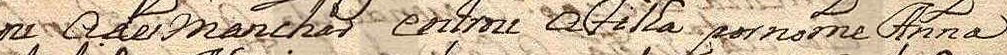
ou a desmanchar entrou a Filha por nome Anna
